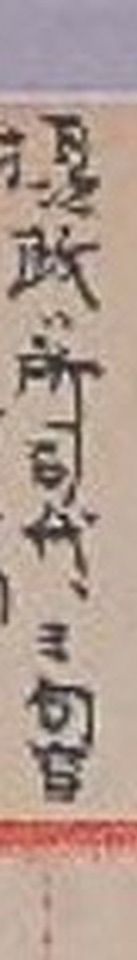摂政ハ所司代、三司官
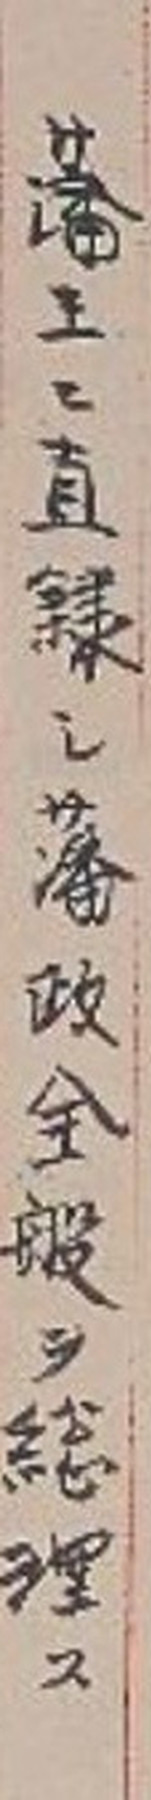藩王ニ直隷シ藩政全般ヲ総理ス
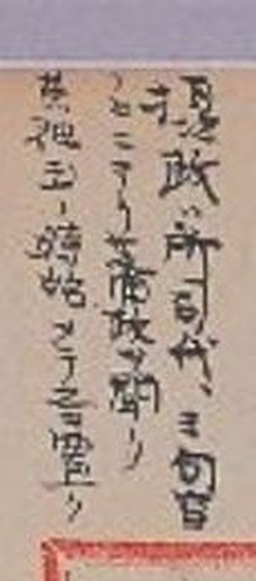ノ上ニアリ藩政ヲ聞ク
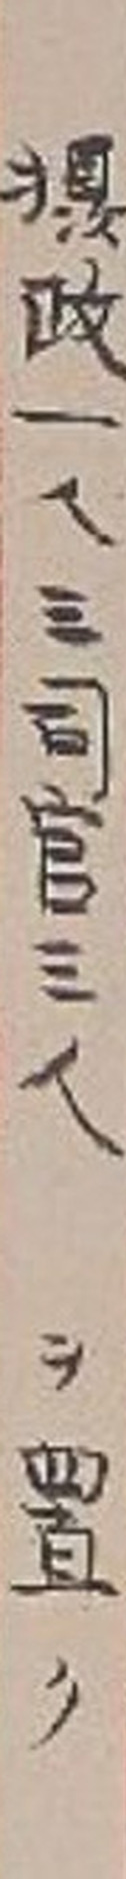摂政一人三司官三人ヲ置ク
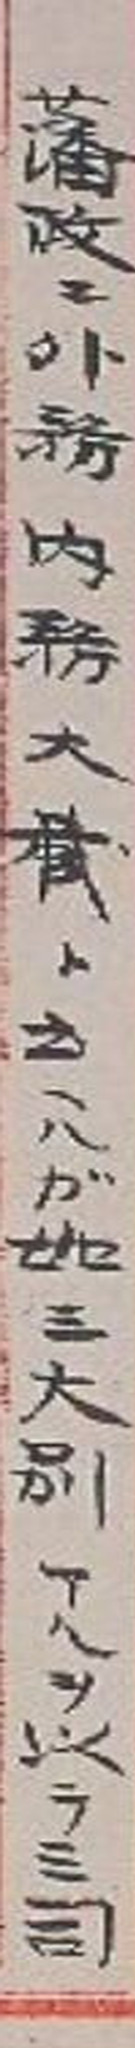藩政ニ外務内務大蔵ト云ヘルガ如三大別アルヲ以テ三司
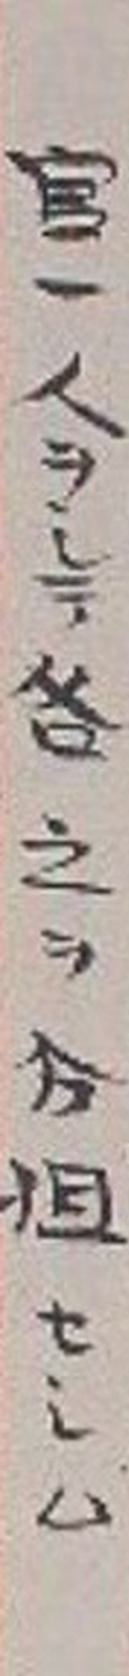官一人ヲシテ各之ヲ分担セシム
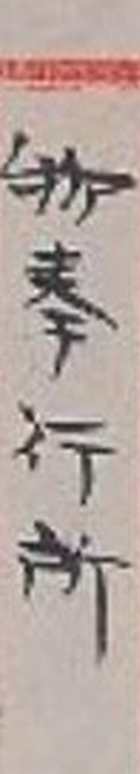物奉行所
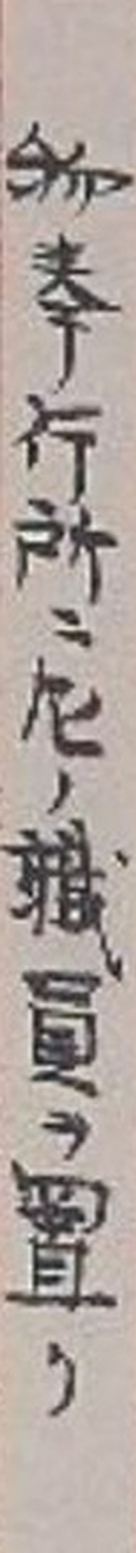物奉行所ニ左ノ職員ヲ置ク
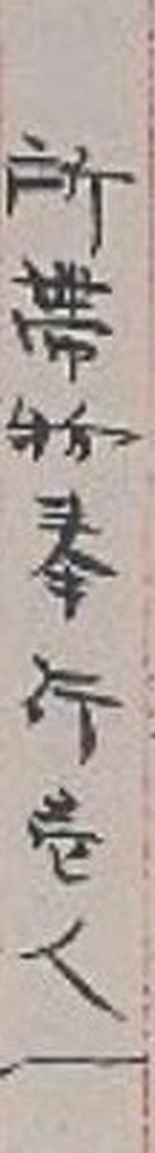所帯物奉行壱人
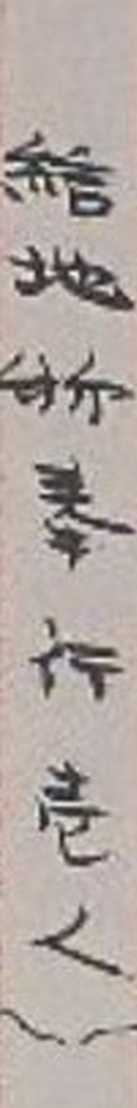給地物奉行壱人
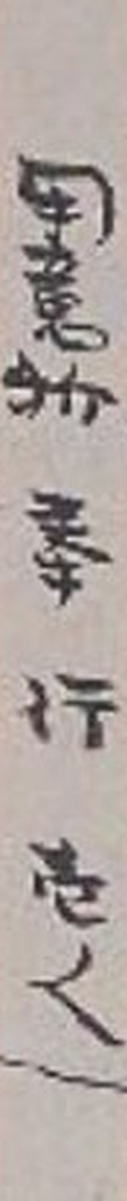所帯物奉行壱人

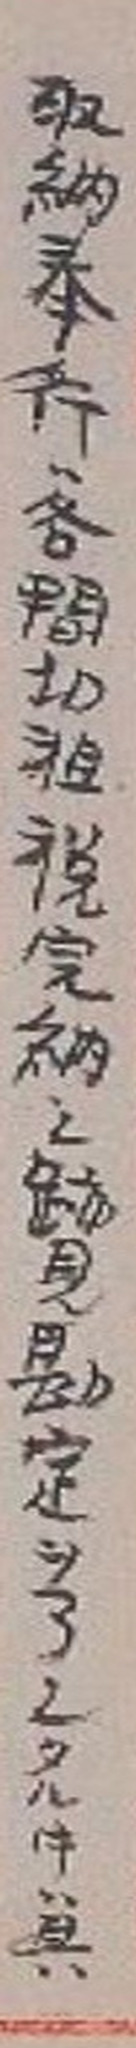取納奉行ハ各間切租税完納シ跡見勘定ヲ了シタルトキハ其
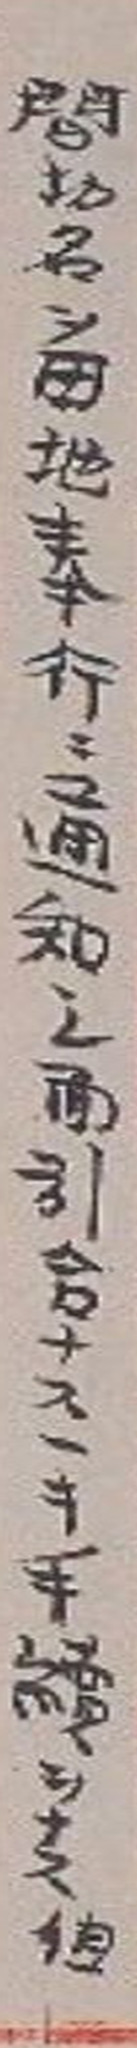間切名ヲ田地奉行ニ通知シ面引合ナスヘキ手続ヲナス但
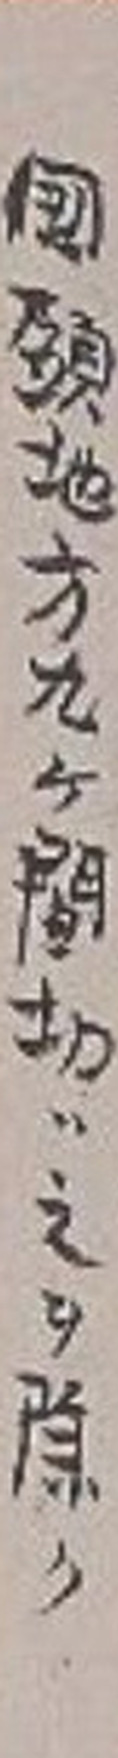国頭地方九ヶ間切ハ之ヲ除ク
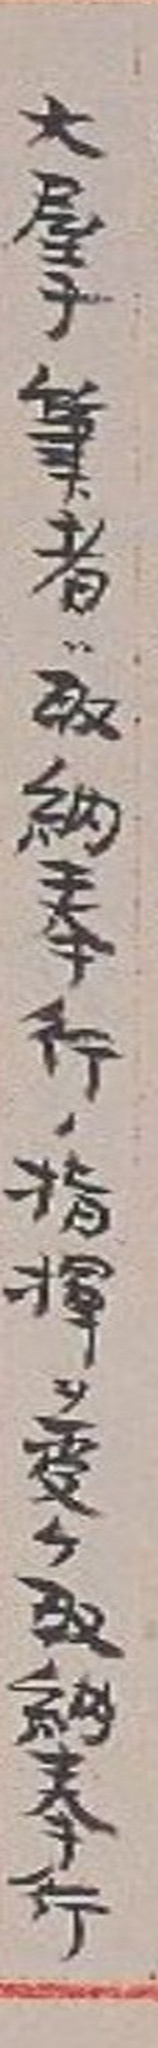大屋子筆者ハ取納奉行ノ指揮ヲ受ケ取納奉行
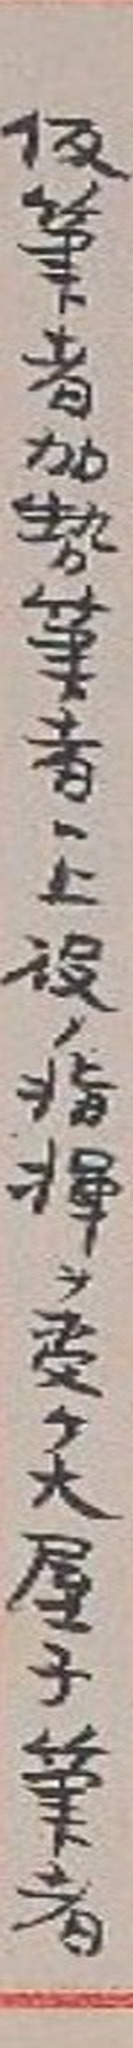仮筆者加勢筆者ハ上役ノ指揮ヲ受ケ大屋子筆者
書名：旧藩中租税徴収ニ関スル事項
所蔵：University of the Ryukyus Library
